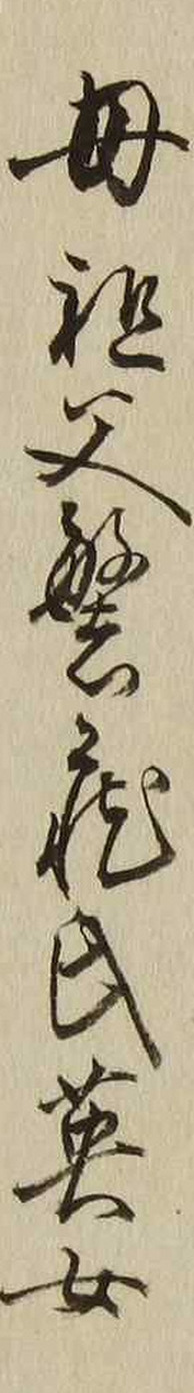母祖父繁蔵氏英女
